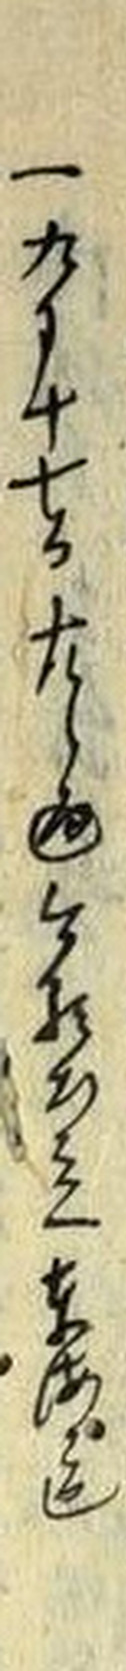九月十七日左之通今朝出立東海道
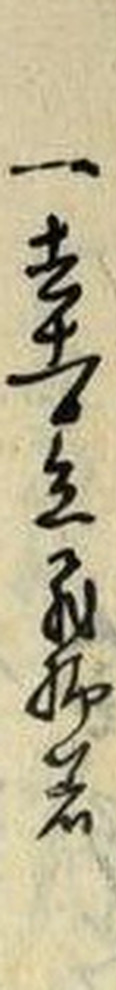一去十一日立飛脚着
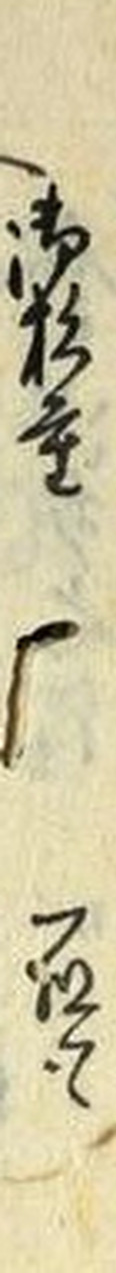御杉重一組ツヽ
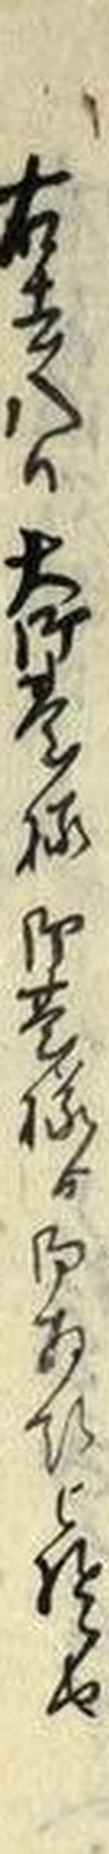右去八日大御台様御台様ゟ御拝領被遊候由
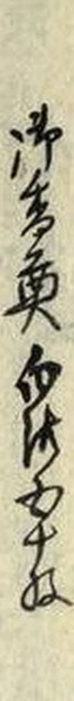御香典白銀五十枚
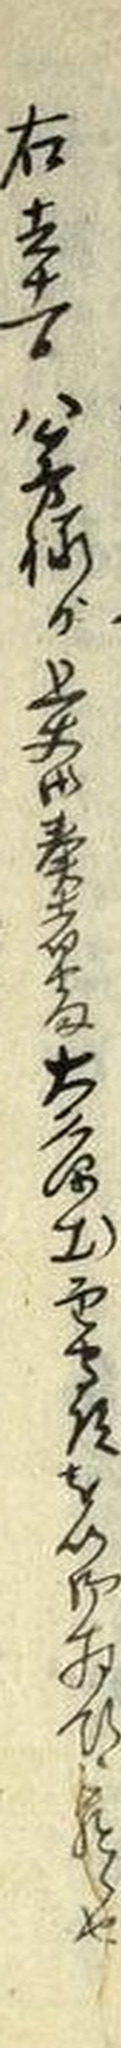右去十一日公方様ゟ上使御奏者番大久保出雲守殿を以御拝領被遊候由
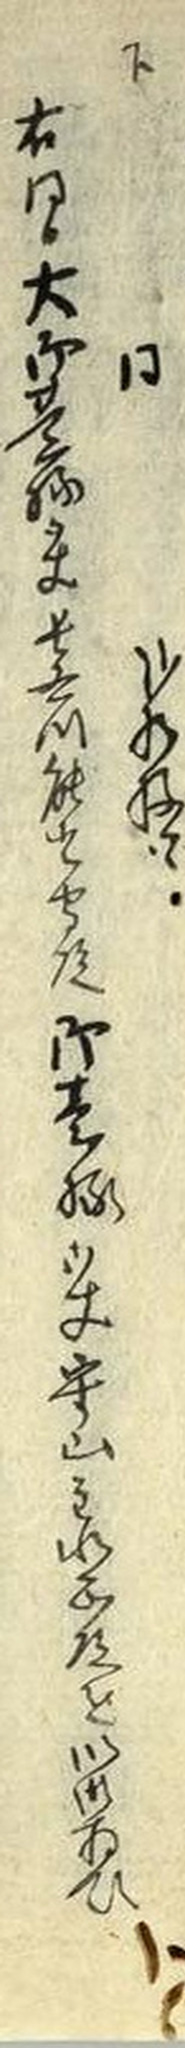右同日大御台様御使長谷川能登守殿御台様御使守山主水正殿を以御拝領
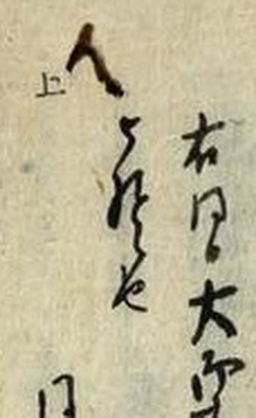被遊候由
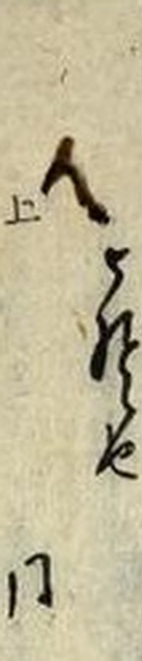被遊候由
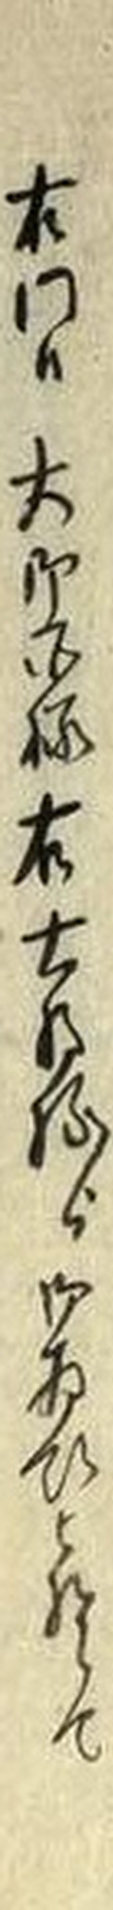右同日大御所様右大将様ゟ御拝領被遊候由
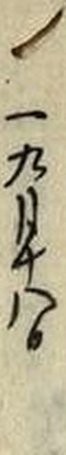一九月十八日
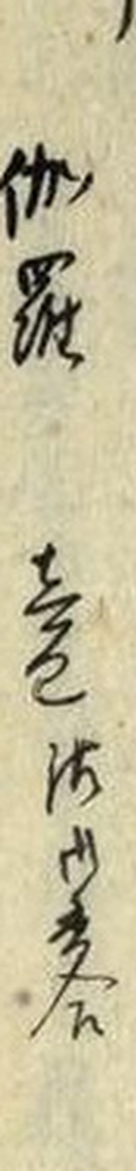伽羅壱包銀御香合
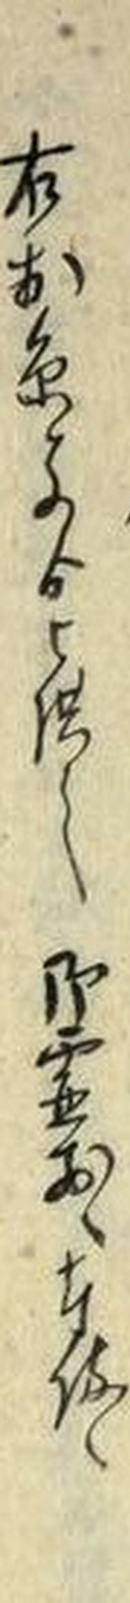右お糸とのゟ被供之御霊前へ奉備候

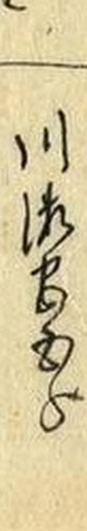同川瀬安五郎
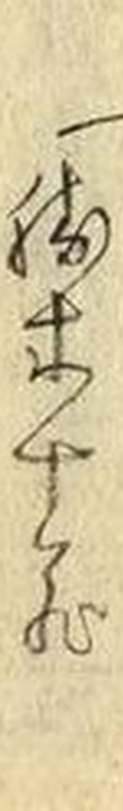勝木十蔵
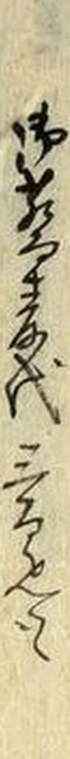御蕎麦代三百疋ツヽ
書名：少傅日録抄（斉善付側向頭取日記、江戸并道中、初入在国、逝去後…
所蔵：福井県文書館 Fukui Prefectural Archives
